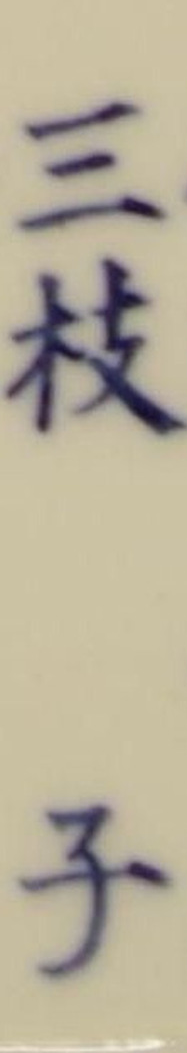三枝子
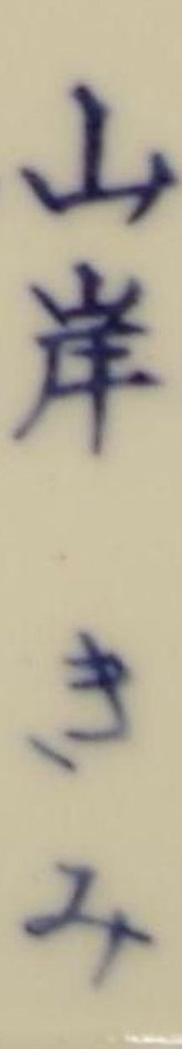山岸きみ
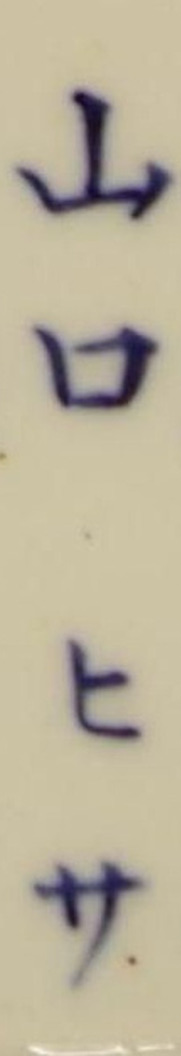山口ヒサ
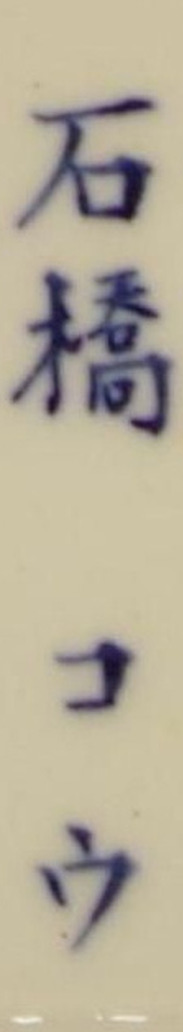石橋コウ
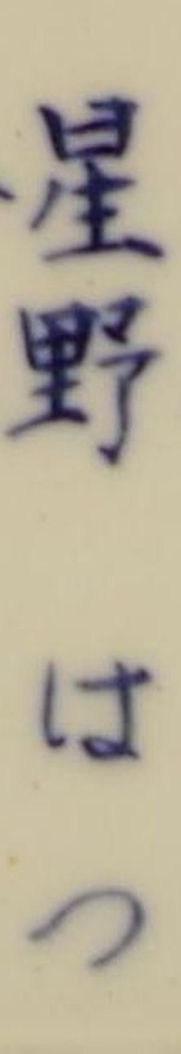星野はつ
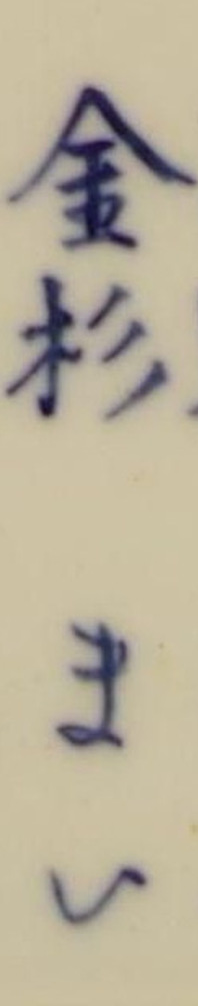金杉まい
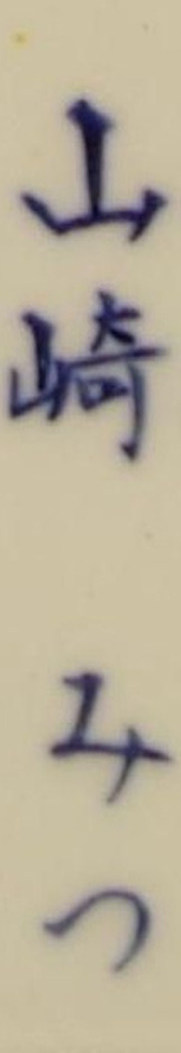山崎みつ
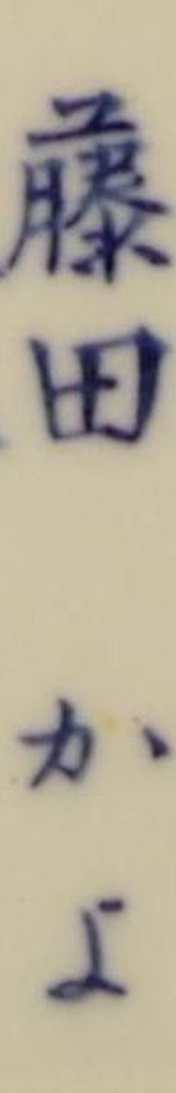藤田かよ
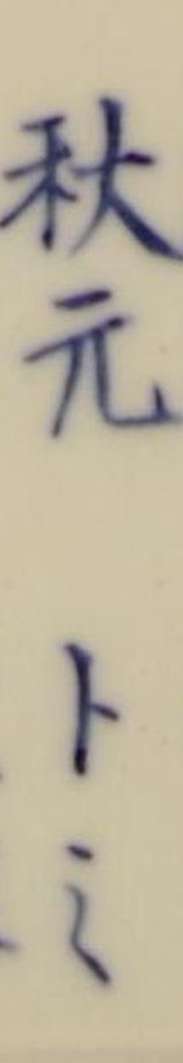秋元トミ
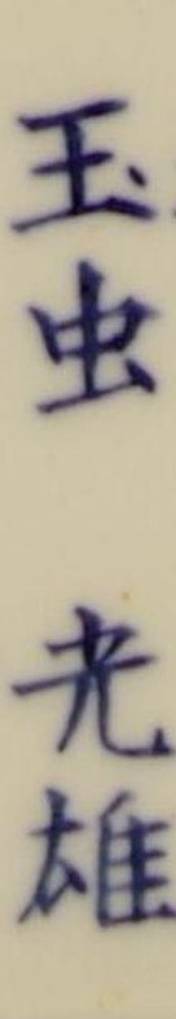玉虫光雄
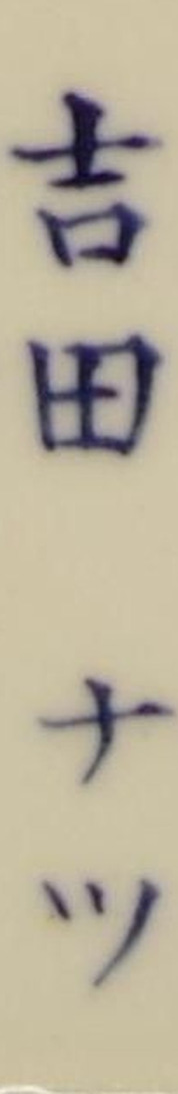吉田ナツ
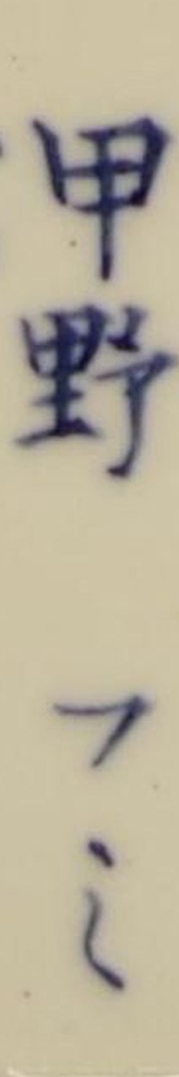甲野フミ
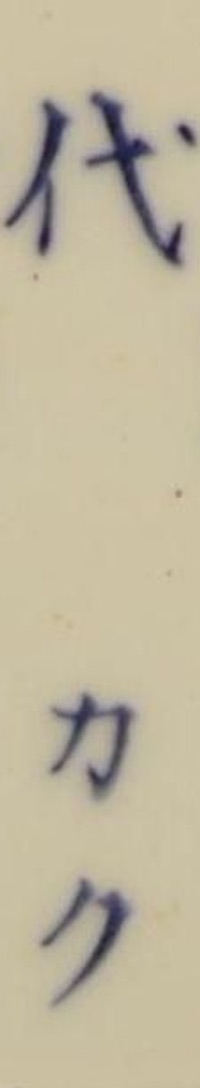代カク
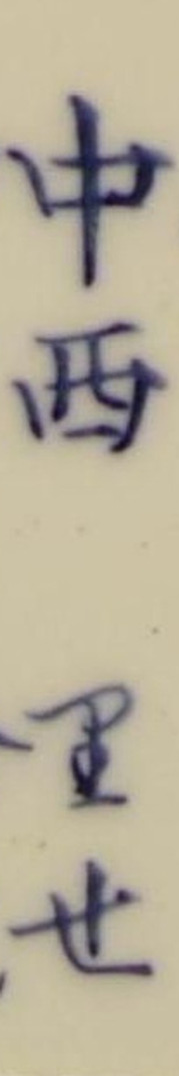中西りせ
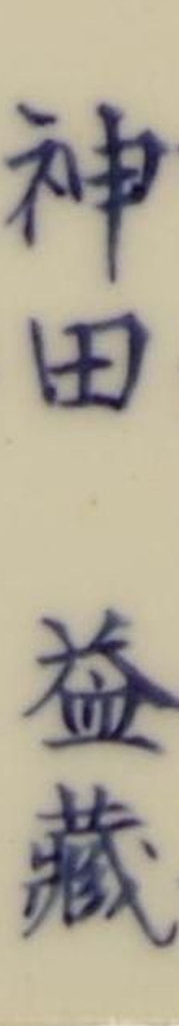神田益蔵
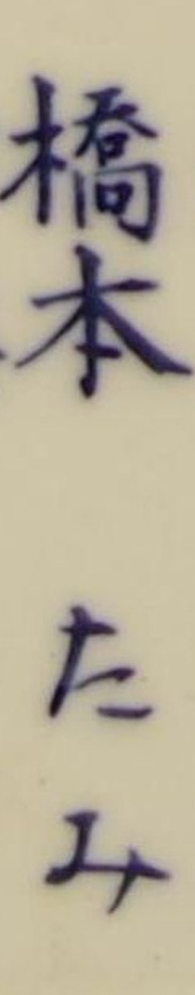橋本たみ
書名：E~L
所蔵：高野山金剛峯寺
